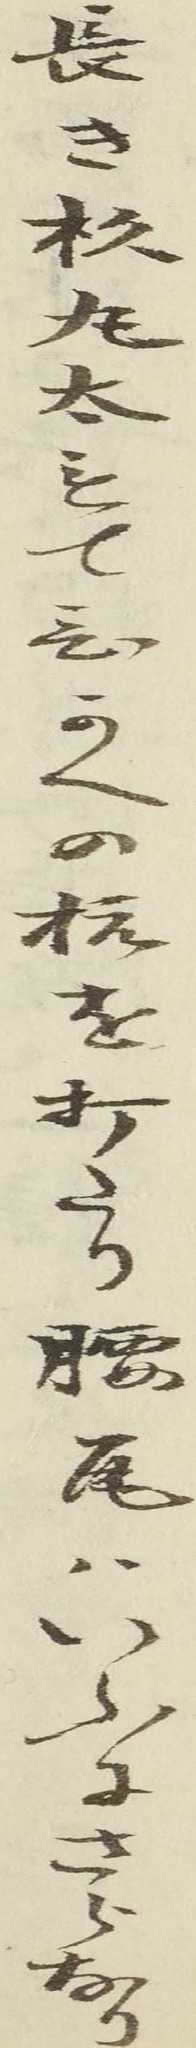長き杉丸太もてひかへの杭を打たり腰瓦ハいふにさらなり
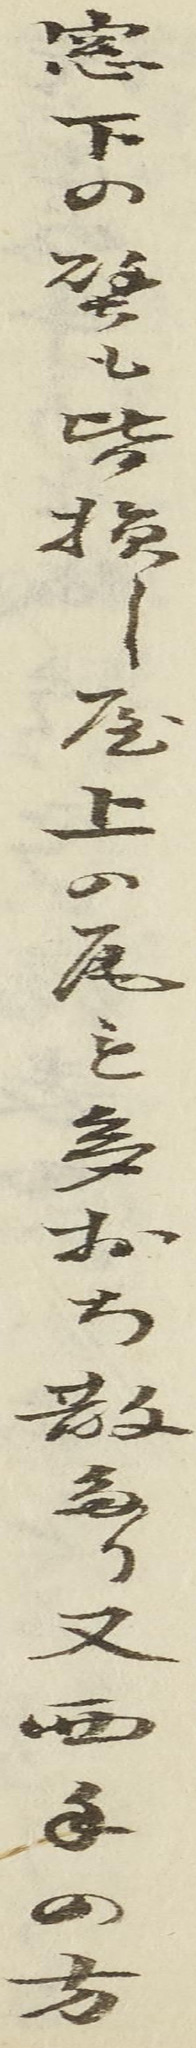窓下の壁も皆損し屋上の瓦も多おち散たり亦西手の方
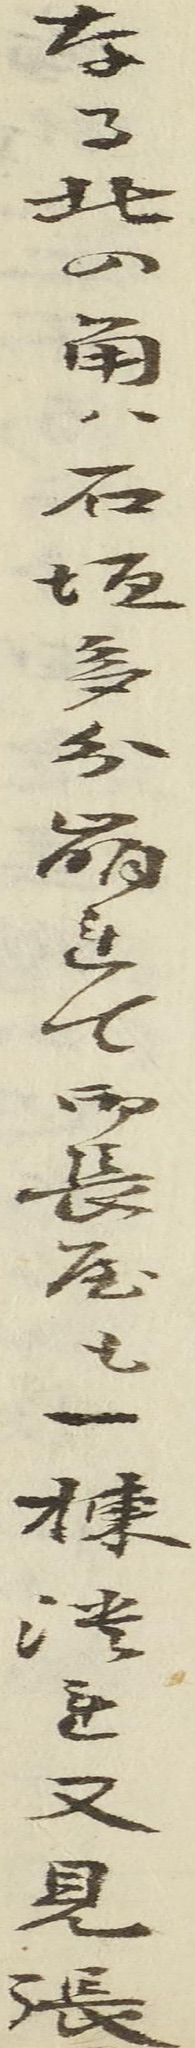なる北の角ハ石垣多分崩れて御長屋も一棟潰れ又見張

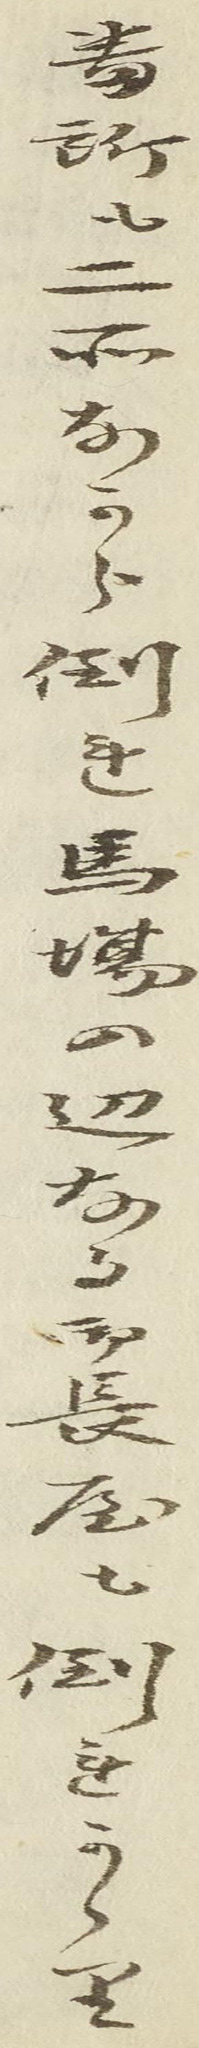番所も二所なから倒れ馬場の辺なる御長屋も倒れかゝり
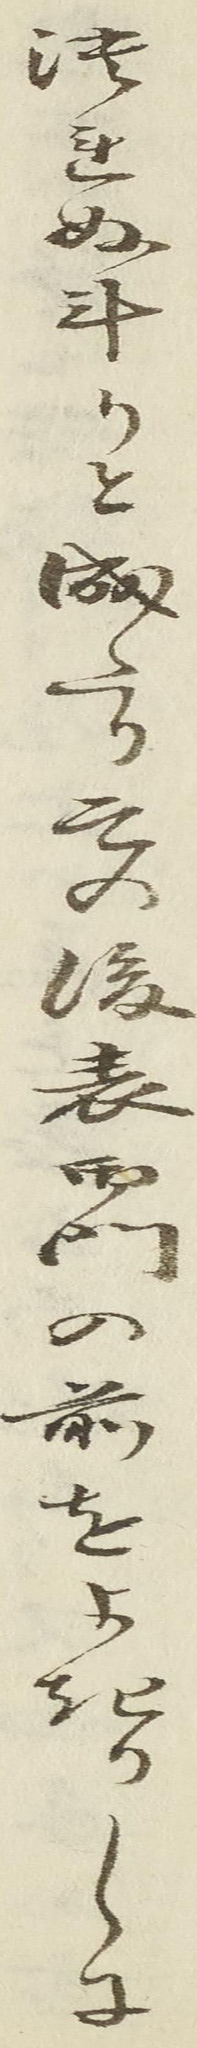潰れぬ斗りと成たりその後表御門の前をよきりしに
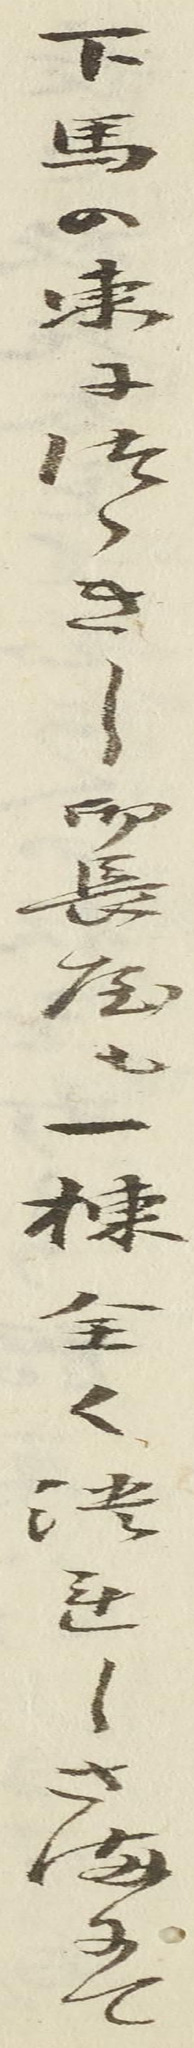下馬の東につゝきし御長屋も一棟全く潰れしさまにて
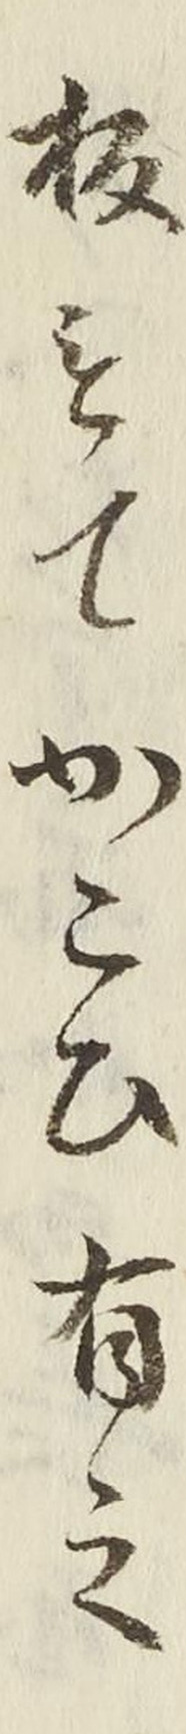板もてかこひ有之
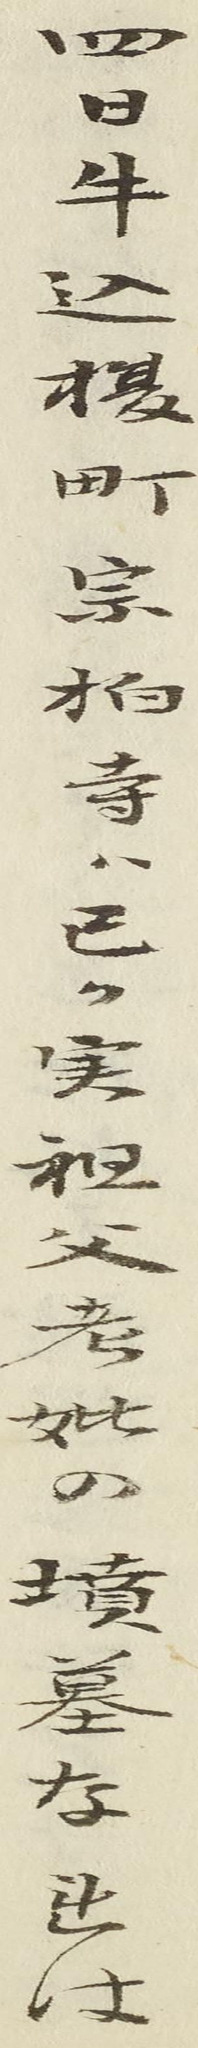四日牛込榎町宗柏寺ハ己か実祖父老妣の墳墓なれは
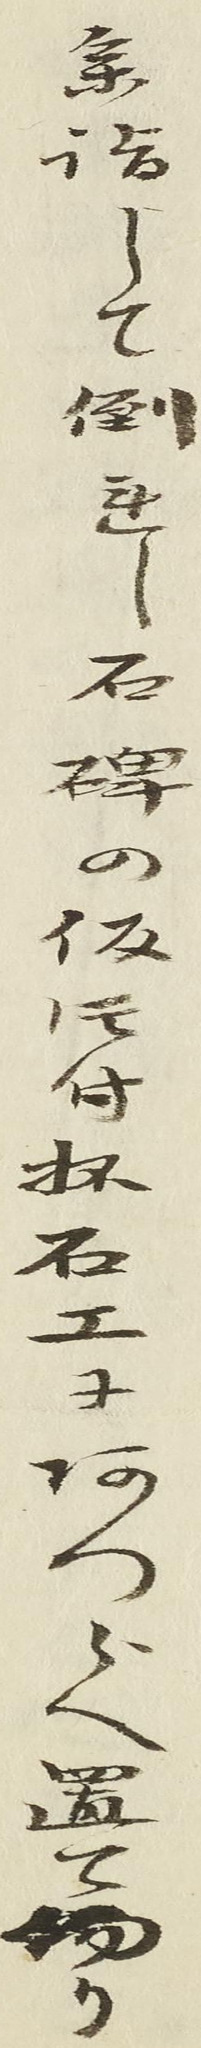参詣して倒れし石碑の仮片付抔石工にあつらへ置て帰り
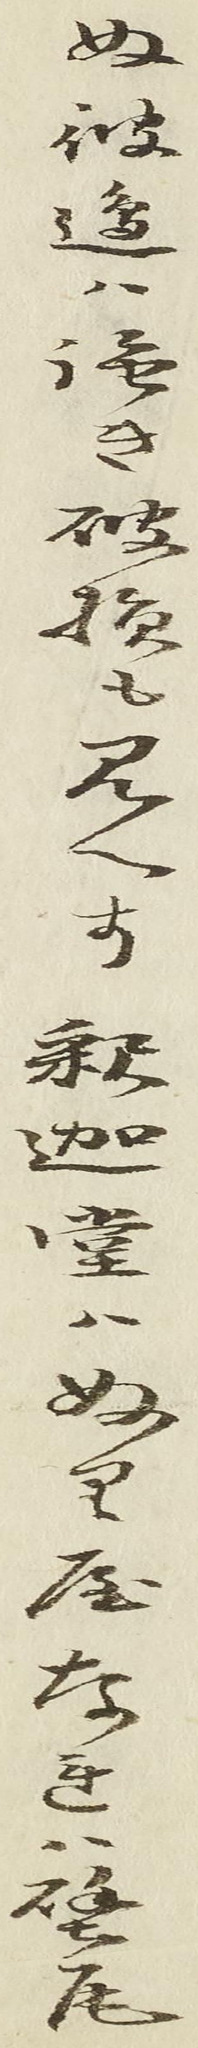ぬ彼辺ハ強き破損も見へす釈迦堂ハぬり屋なれハ壁瓦
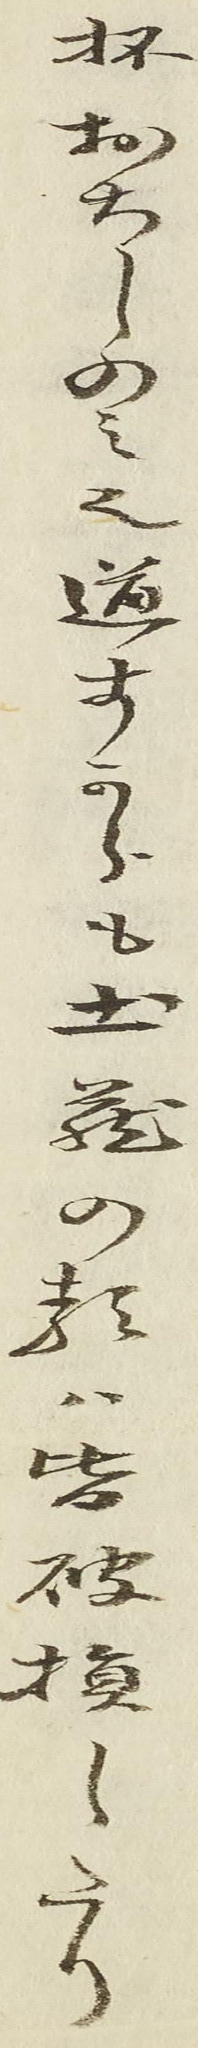抔おちしのミ也道すからも土蔵の類は皆破損したり
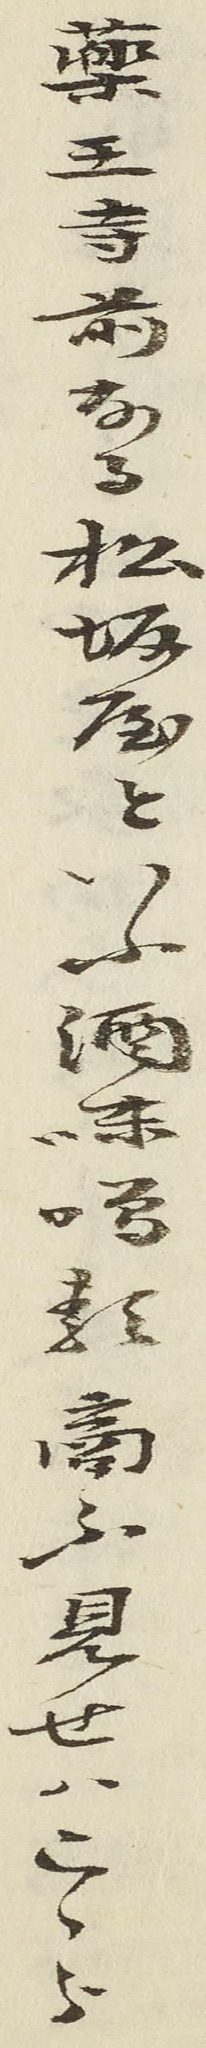薬王寺なる前松坂屋といふ酒味噌類商ふ見せハこゝら
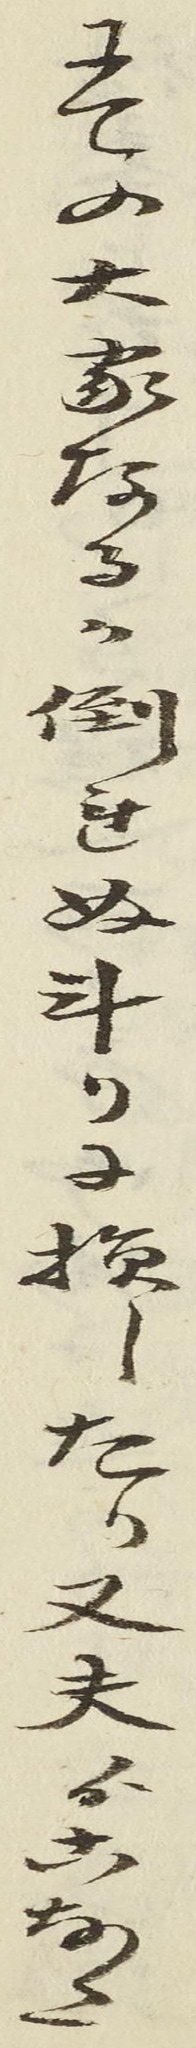にてハ大家なるか倒れぬ斗りに損したり又夫ゟこなた
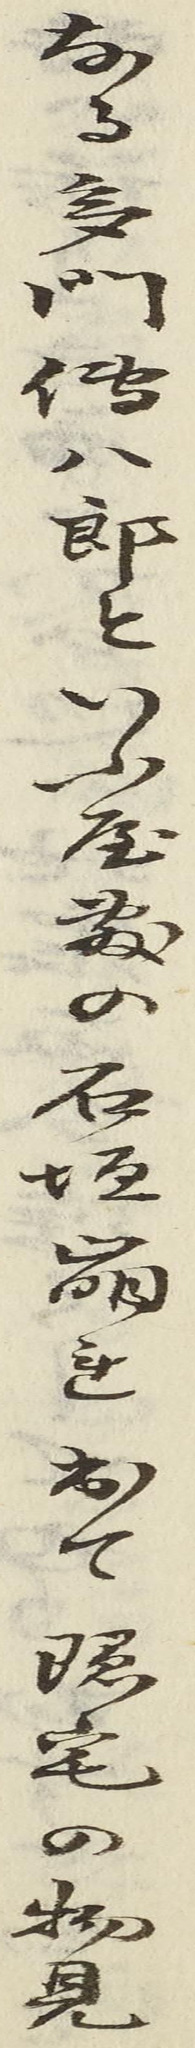なる多門伝八郎といふ屋敷の石垣崩れ出て隠宅の物見
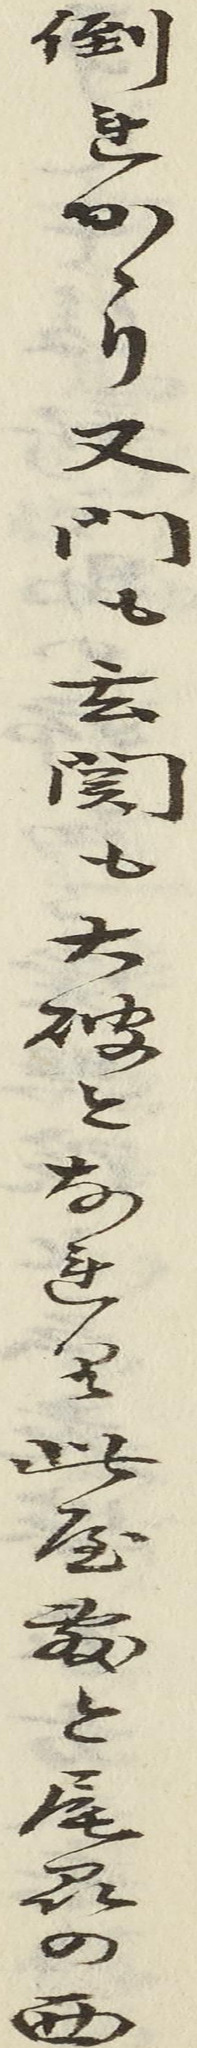倒れかゝり又門も玄関も大破となれり此屋敷と尾州の西
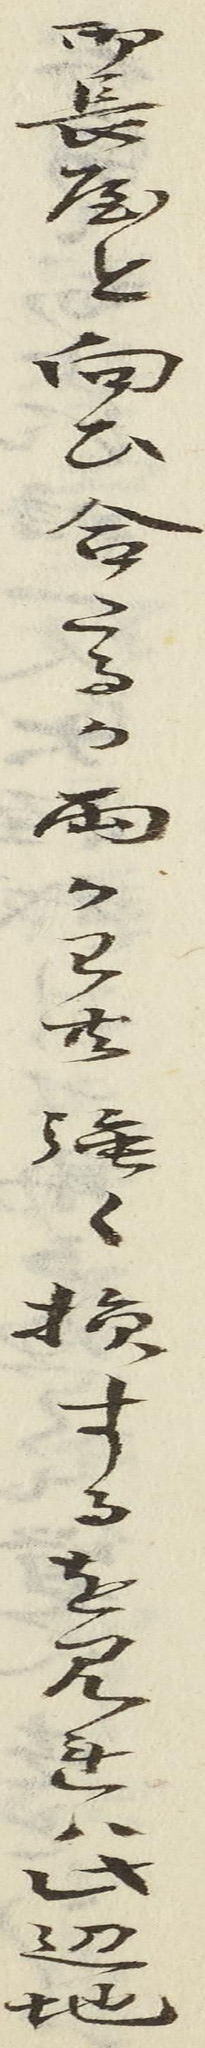御長屋と向ひ合たるか両かわ共強く損するを見れハ此辺地
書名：那為の後見艸　全
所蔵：東京大学地震研究所図書室 Earthquake Research Institute Library, The University of Tokyo, JAPAN
